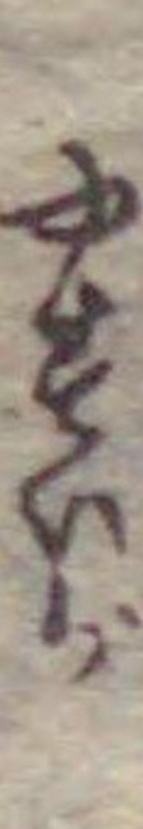やすいが
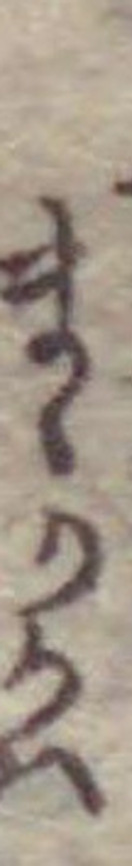まゝのかは
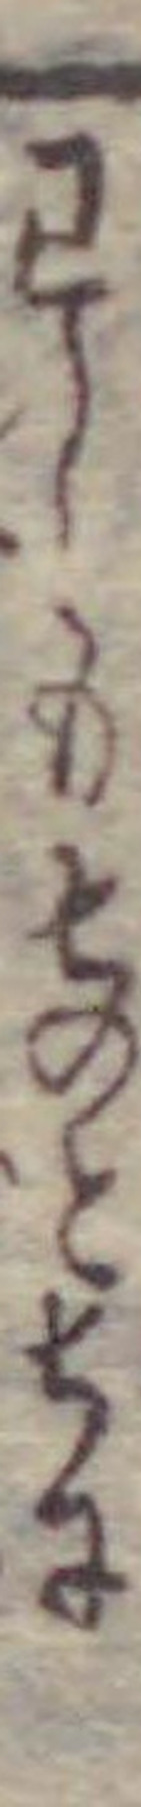わしもこのとちに
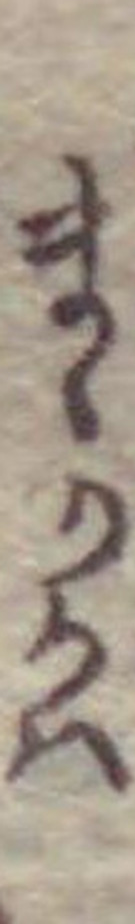まゝのかは
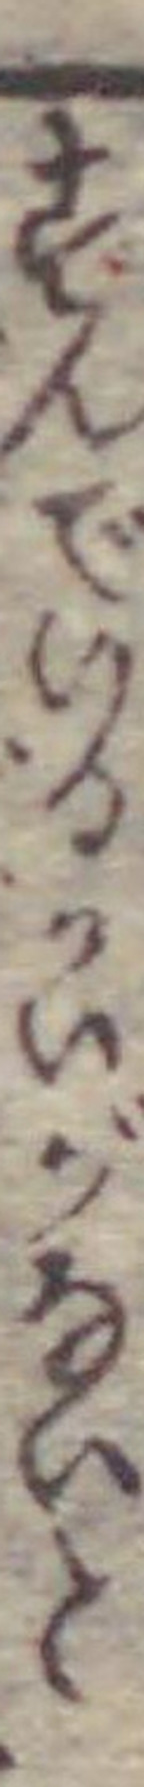すんでいるかいがないと
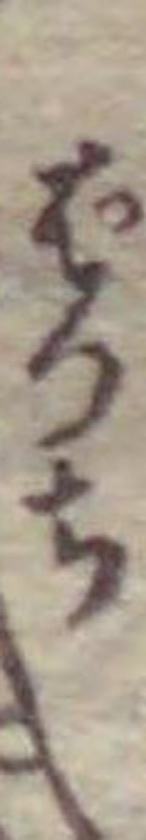ぱつち
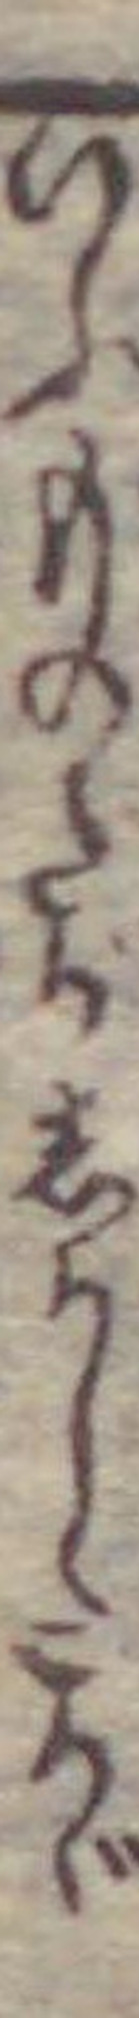いふものだがしかしたかゞ
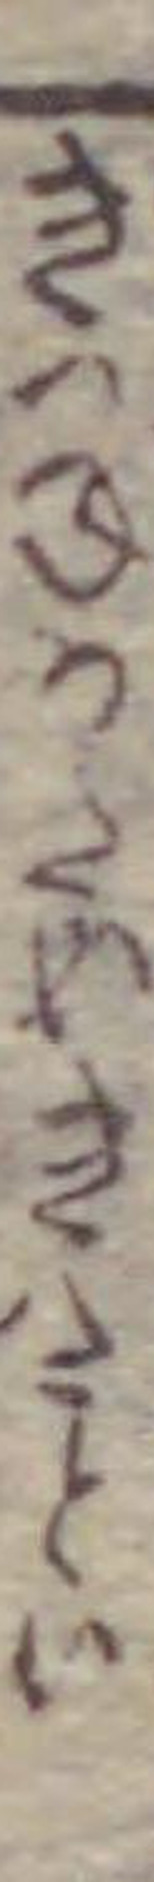きつねかためきたとい
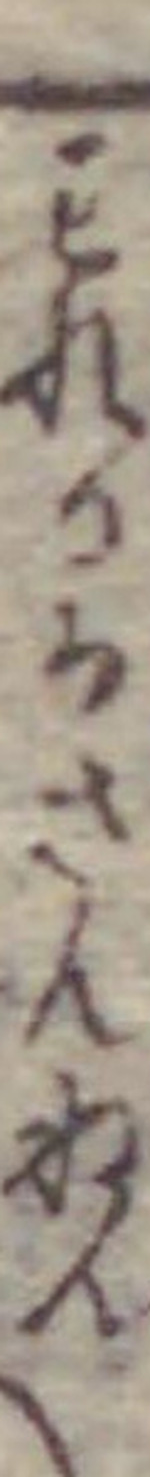われるかさんねん
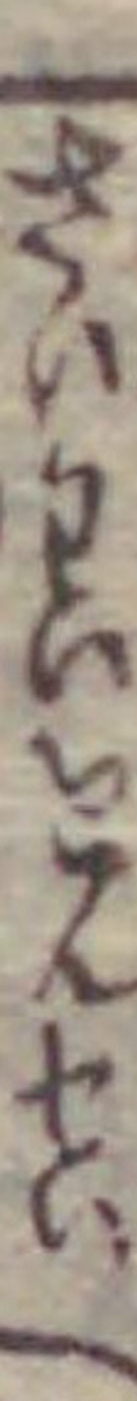さいわいせんせい
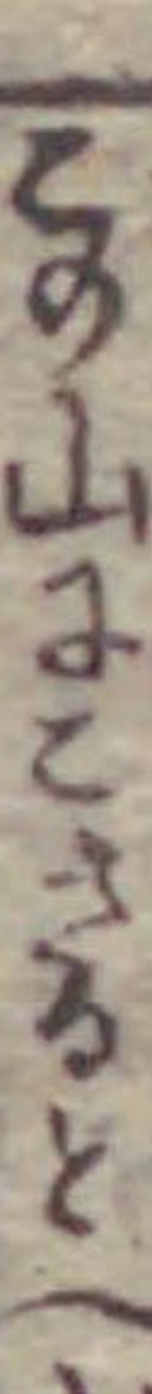この山にこさると
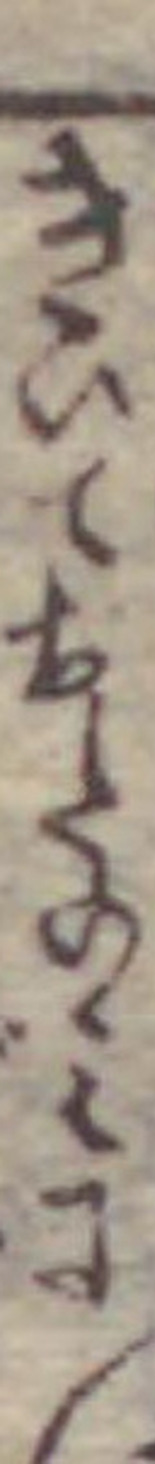きいておたのみに
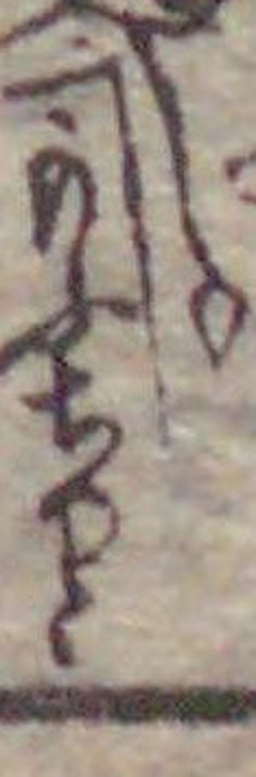〽もふちつと
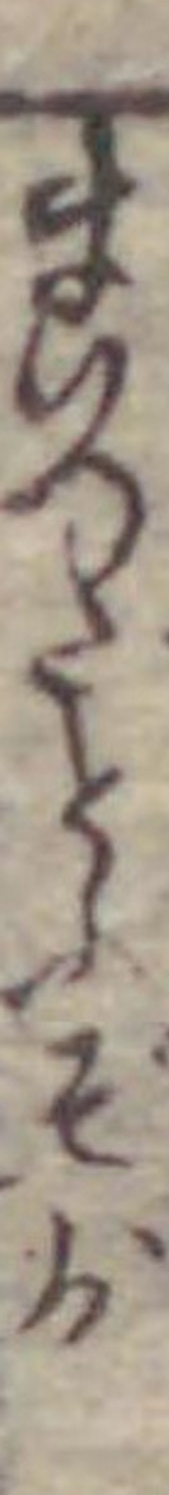まいつたとふぞお
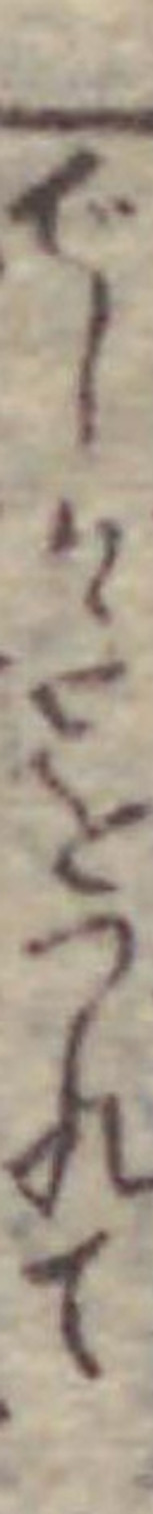でしかたをつれて
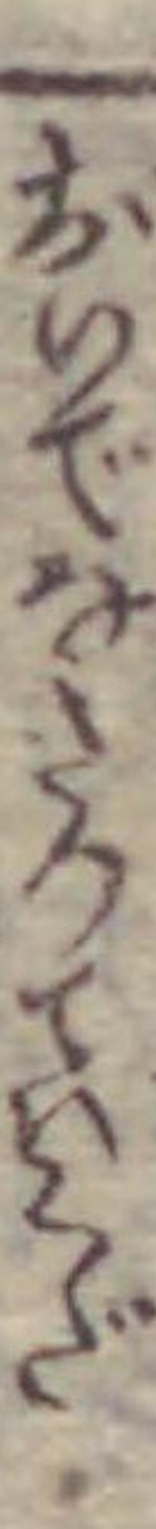おいでなさつてはくだ
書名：化物見世開 : 2巻
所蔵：国立国会図書館 National Diet Library, JAPAN
